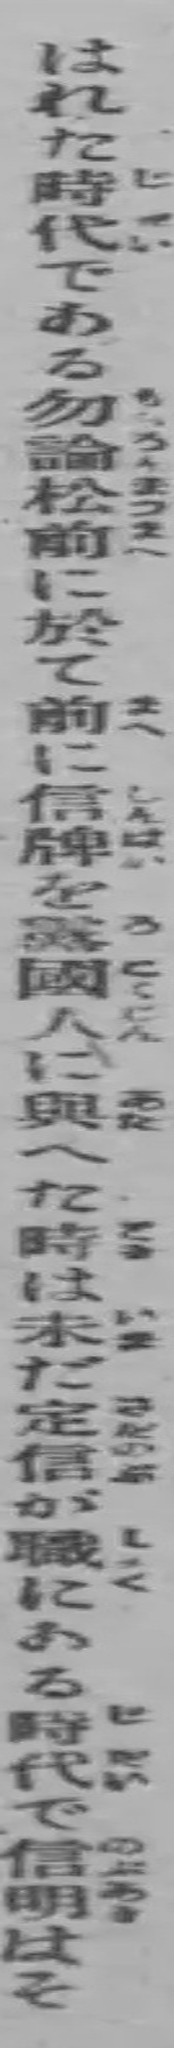はれた時代である勿論松前に於て前に信牌を露国人に与へた時は未だ定信が職にある時代で信明はそ
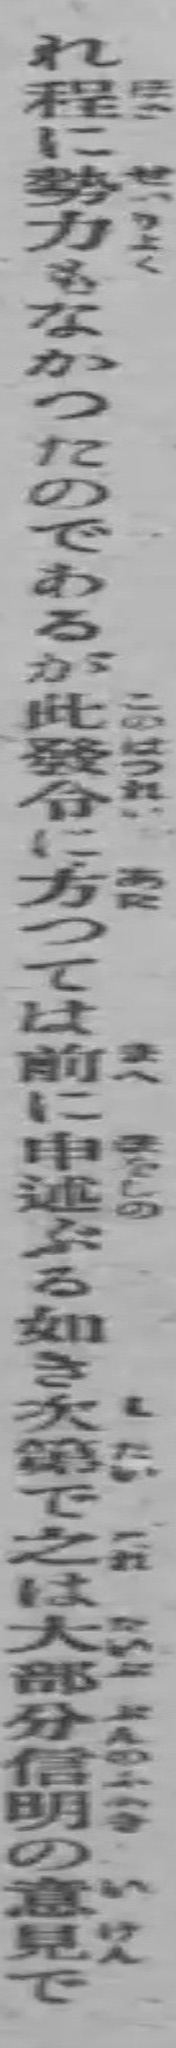れ程に勢力もなかつたのであるが此発令に方つては前に申述ぶる如き次第で之は大部分信明の意見で
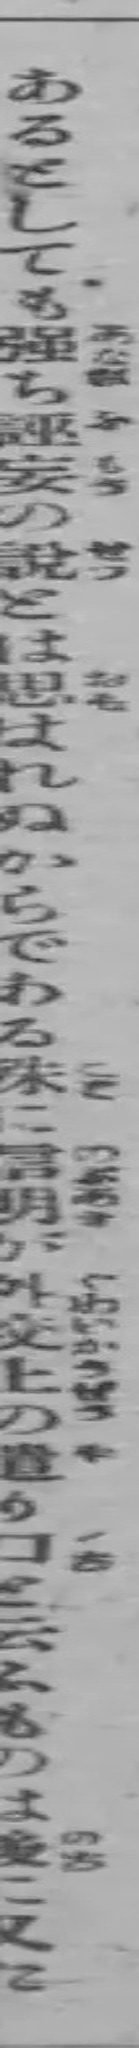あるとしても強ち誣妄の説とは思はれぬからである殊に信明が外交上の遣り口と云ふものは後に又た
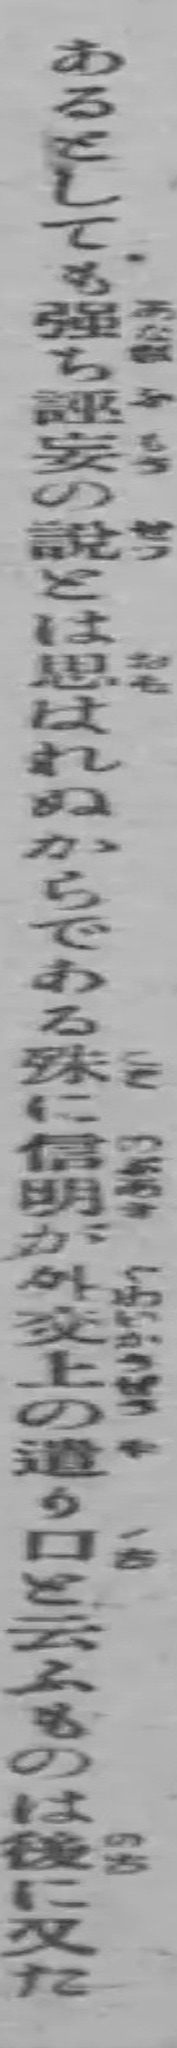あるとしても強ち誣妄の説とは思はれぬからである殊に信明が外交上の遣り口と云ふものは後に又た
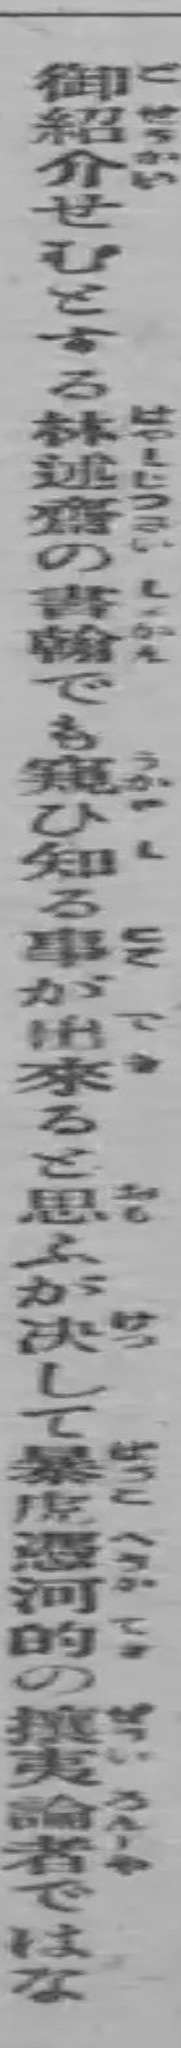御紹介せむとする林述斉の書翰でも窺ひ知る事が出来ると思ふが決して暴虎馮河的の攘夷論者ではな
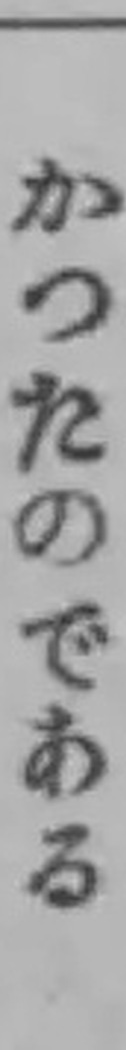かつたのである
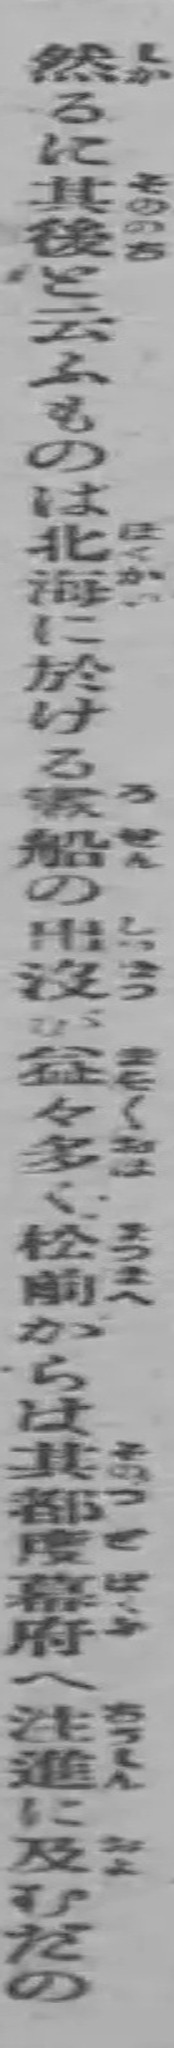然るに其後と云ふものは北海に於ける露船の出没が益々多く松前からは其都度幕府へ注進に及むだの
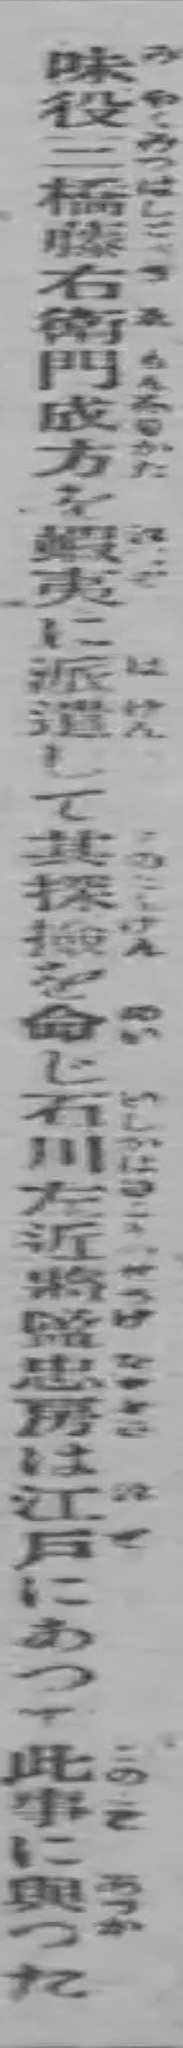味役三橋藤右衛門成方を蝦夷に派遣して其探検を命じ石川左近将監忠房は江戸にあつて此事に与つた
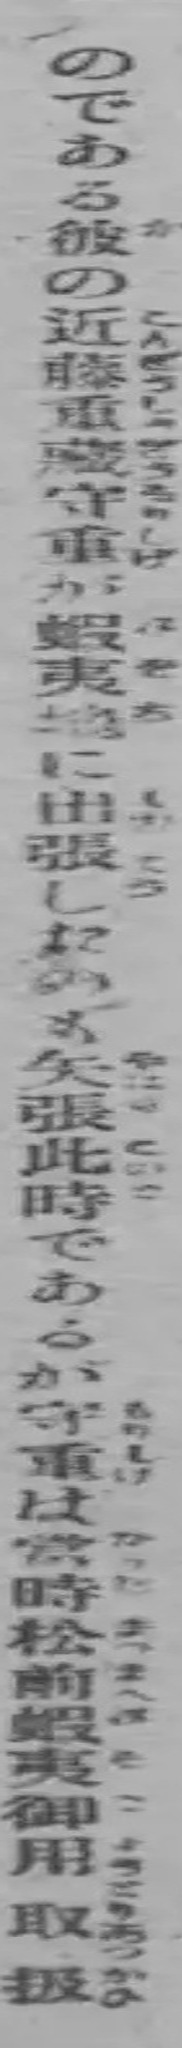近藤重蔵のである彼の近藤重蔵守重が蝦夷地に出張したのも矢張此時であるが守重は当時松前蝦夷御用取扱
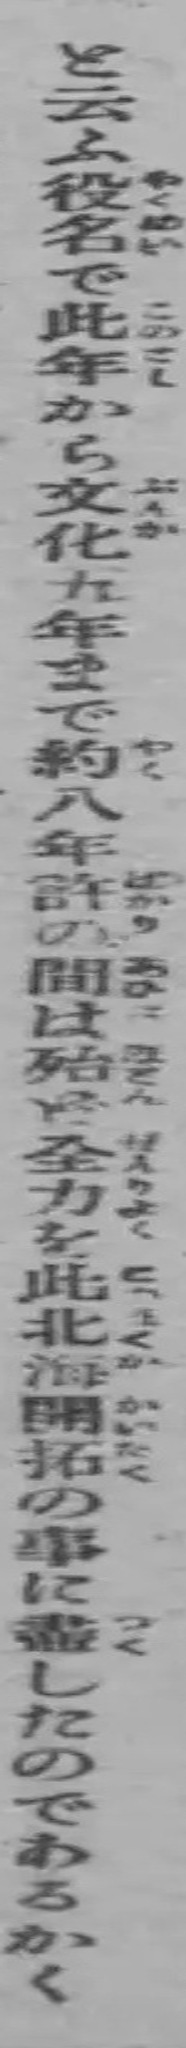と云ふ役名で此年から文化五年まで約八年許の間は殆ど全力を此北海開拓の事に尽したのであるかく
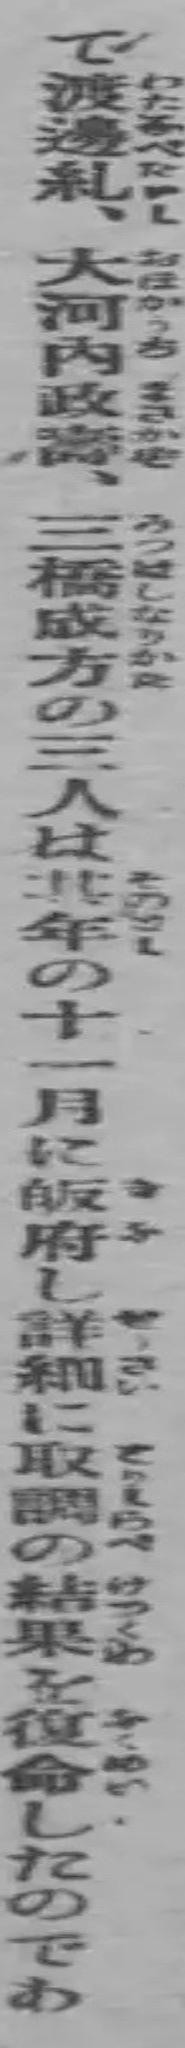て渡邊糺、大河内政壽、三橋成方の三人は其年の十一月に皈府し詳細に取調の結果を復命したのであ
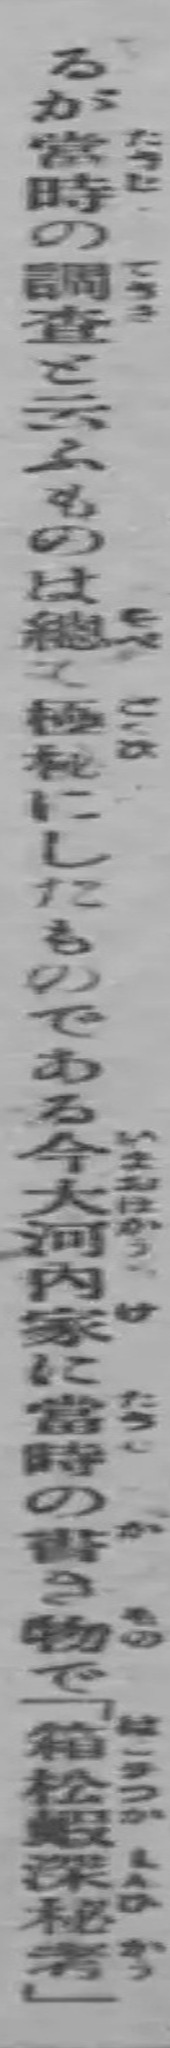箱松蝦深秘考るが当時の調査と云ふものは総て極秘にしたものである今大河内家に当時の書き物で「箱松蝦深秘考」
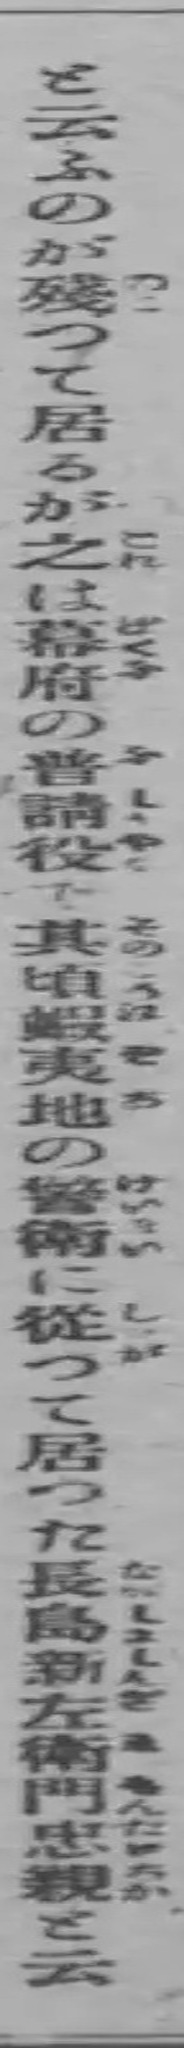長島忠親と云ふのが残つて居るが之は幕府の普請役で其頃蝦夷地の警衛に従つて居つた長島新左衛門忠親と云
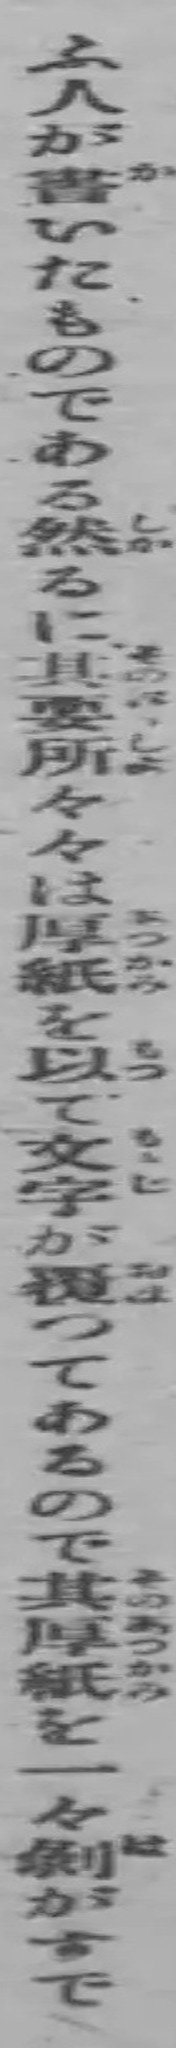ふ人が書いたものである然るに其要所々々は厚紙を以て文字が覆つてあるので其厚紙を一々剥がすで
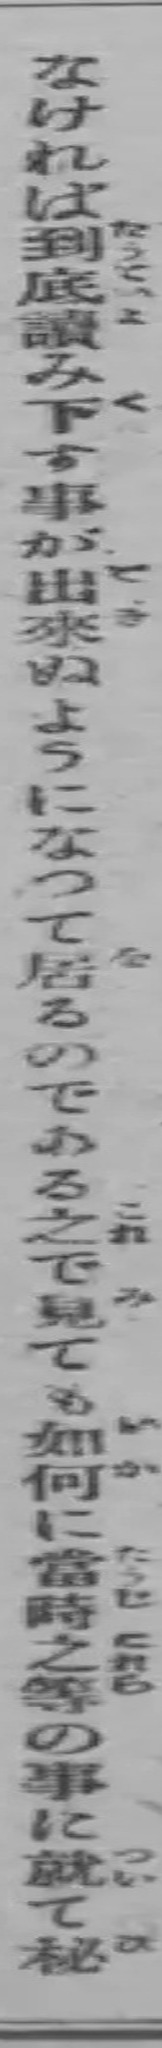なければ到底読み下す事が出来ぬようになつて居るのである之で見ても如何に当時之等の事に就て秘
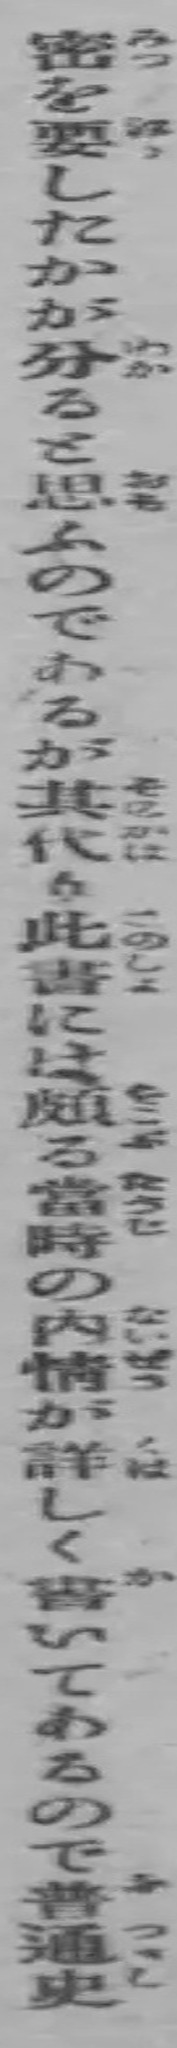蜜を要したかが分ると思ふのであるが其代り此書には頗る当時の内情が詳しく書いてあるので普通史
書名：豊橋市史談
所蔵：国立国会図書館 National Diet Library, JAPAN
